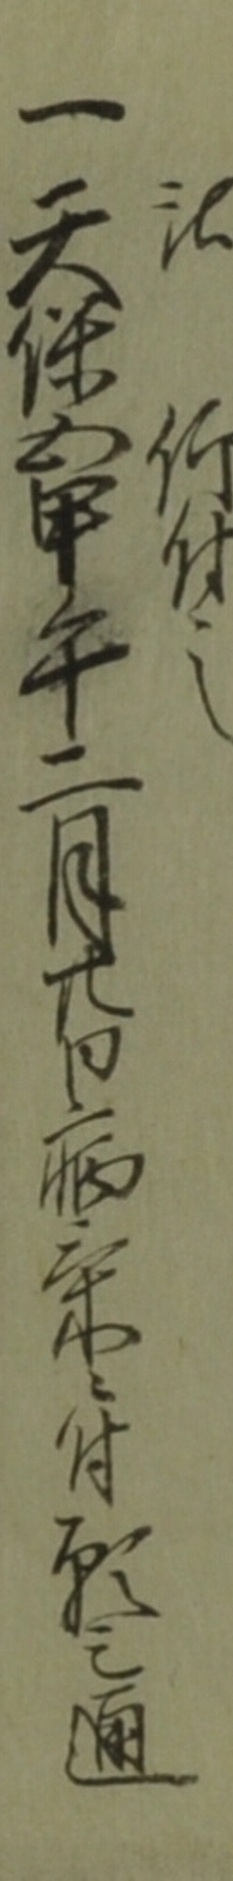一天保五甲午二月廿日病気ニ付願之通
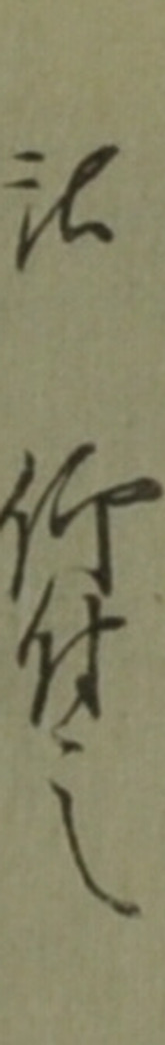被仰付之
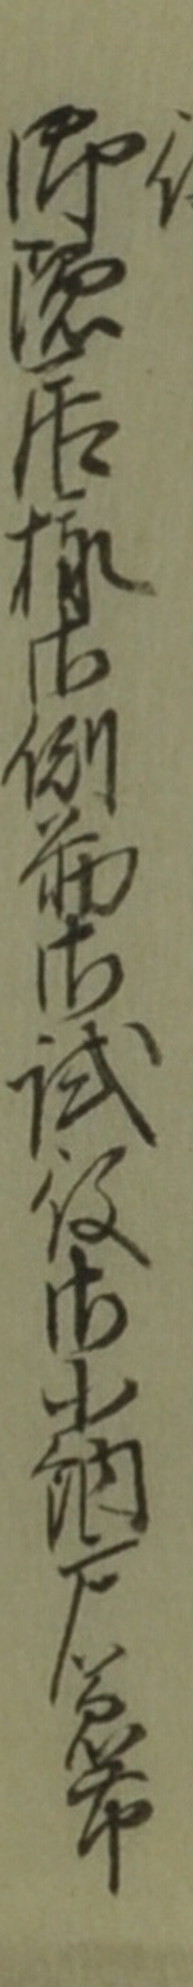御隠居様御側僅御試役御小納戸兼帯
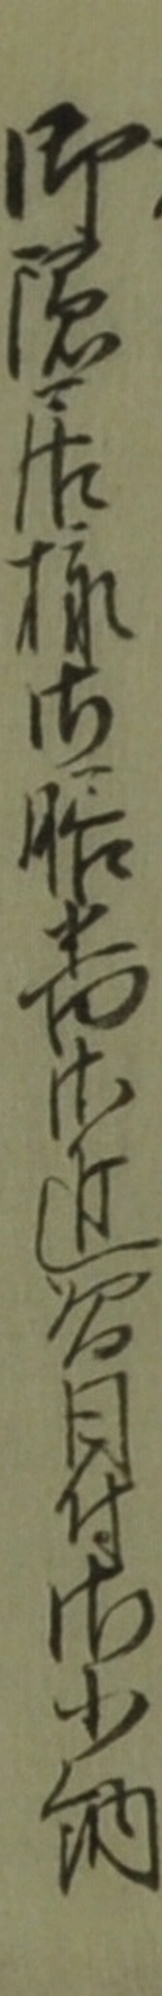御隠居様御膳番御近習目付御小納
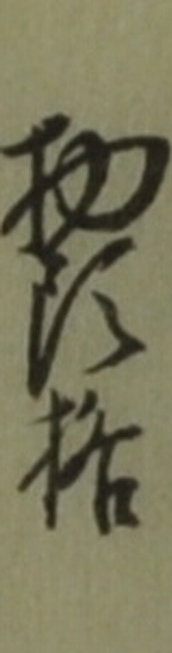物頭格
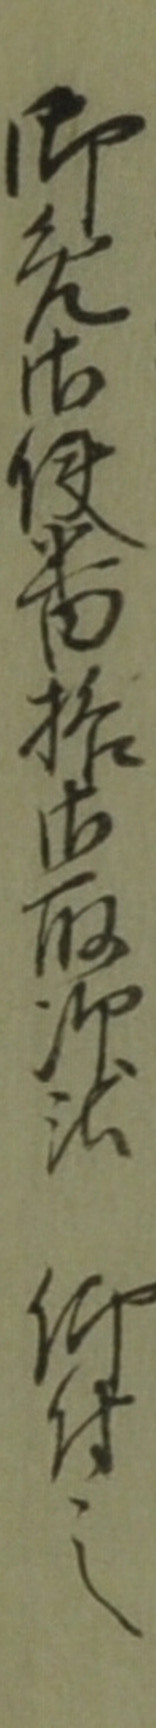一御免御使番格御取次被仰付之
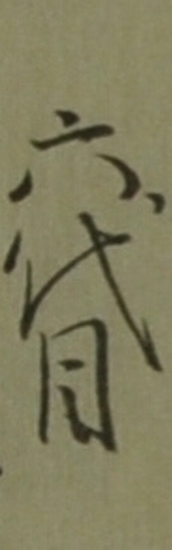六代目
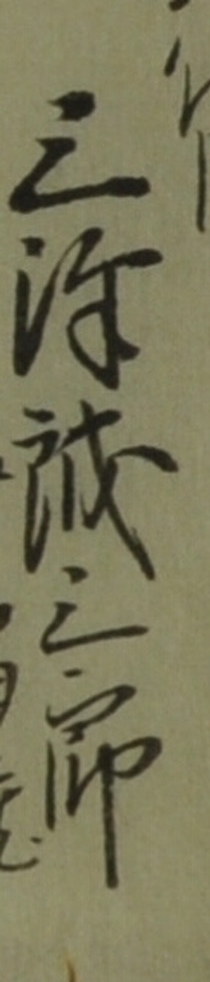三沢誠三郎

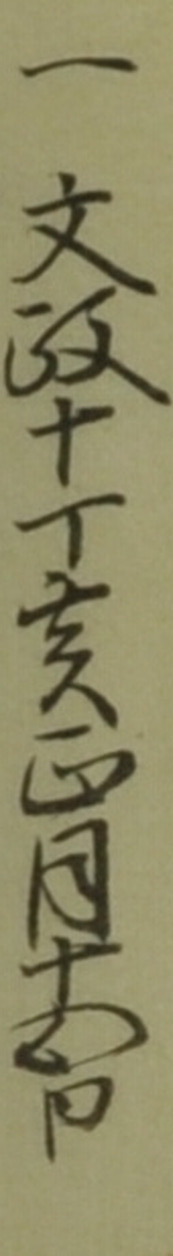一文政十丁亥正月十五日
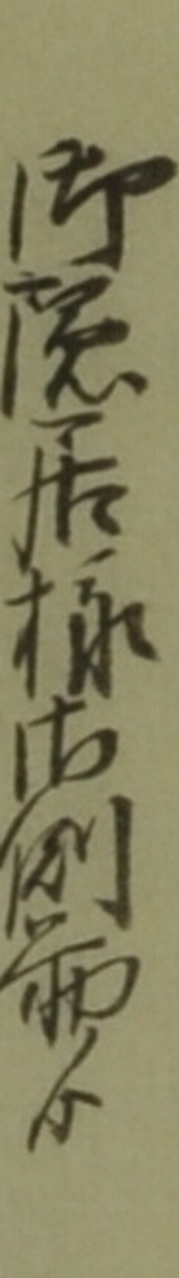御隠居様御側勤方ゟ
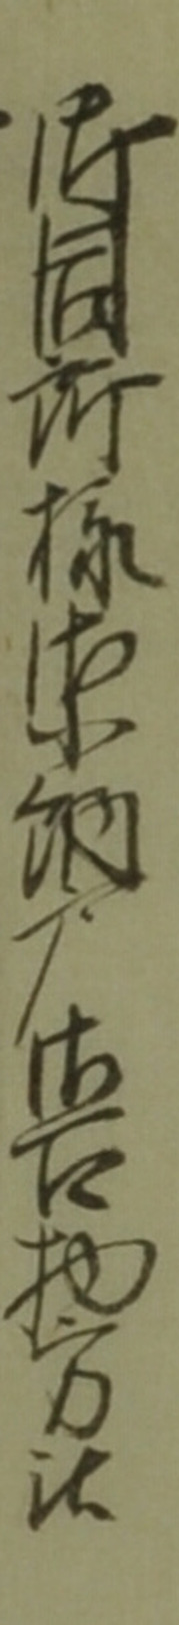御同所様御小納戸御召物方被
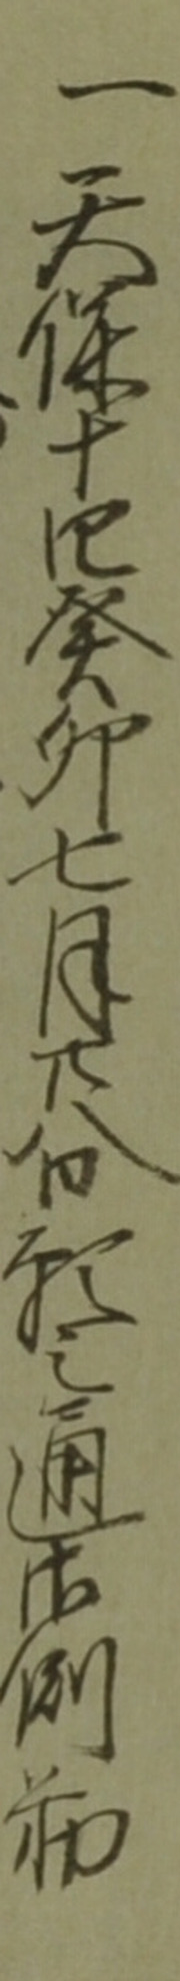一天保十四癸七月廿八日願之通御側勤
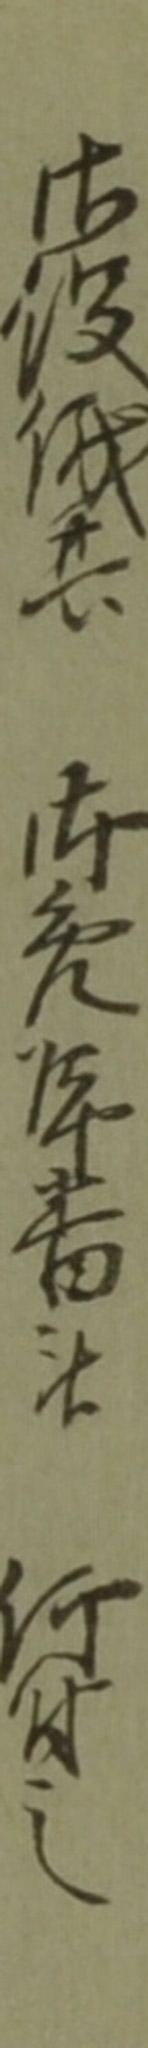御役儀共御免帰番被仰付之
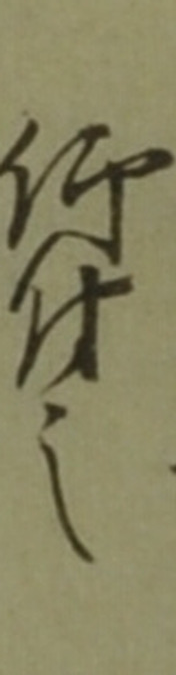仰付之
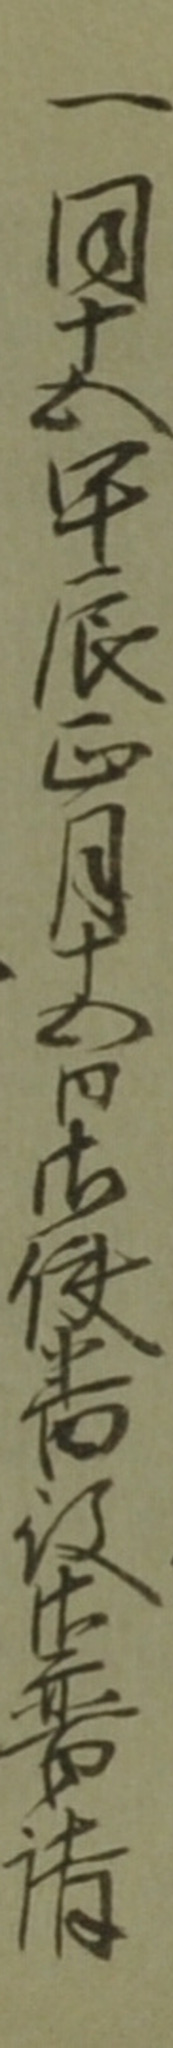一同十五甲辰正月十五日御使番役御普請
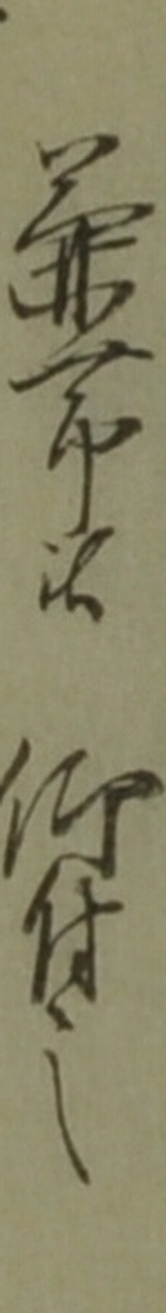兼帯被仰付之
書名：諸御役代々録（四）
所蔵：伊那市立高遠町図書館・合同会社AMANE
